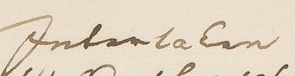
Interlaken
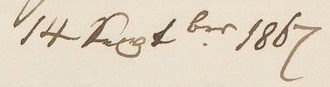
14 Septber 1867
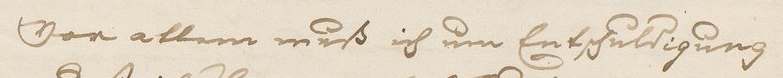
Vor allem muß ich um Entschuldigung
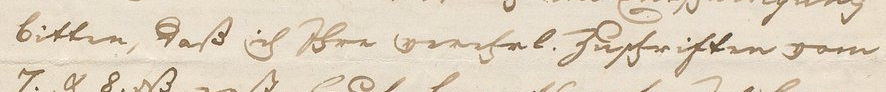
bitten, daß ich Ihre verehrl. Zuschriften vom
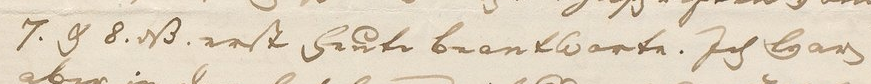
7. & 8. dß. erst heute beantworte. Ich war
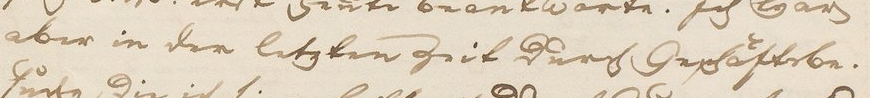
aber in der letzten Zeit durch Geschäftsbe-
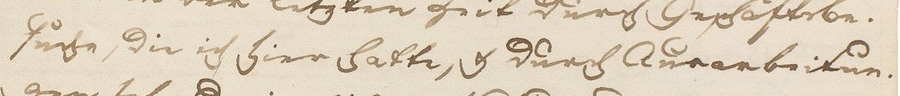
suche die ich hier hatte, & durch Ausarbeitun-
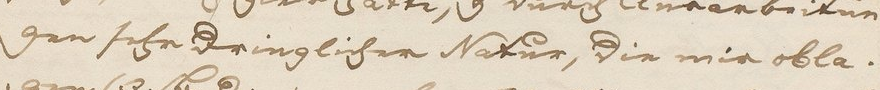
gen sehr dringliche Natur, die mir obla-
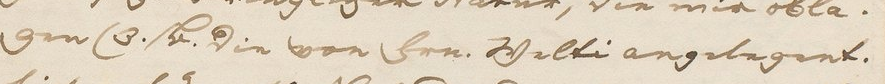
gen (z. B. die von Hrn. Welti angelegent-
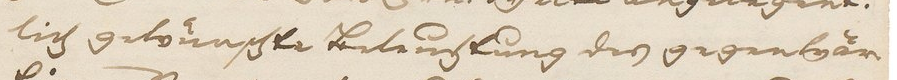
lich gewünschte Beleuchtung des gegenwär-
